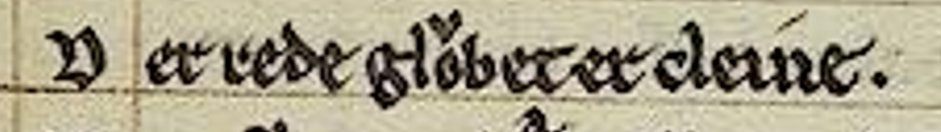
Der rede glo°vbet er cleine.
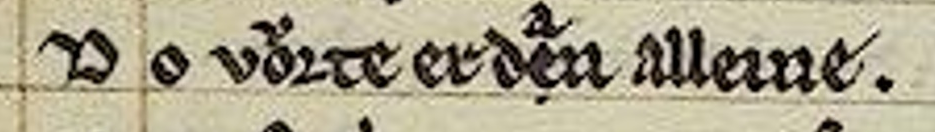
Do vo°vrte er de°an alleine.
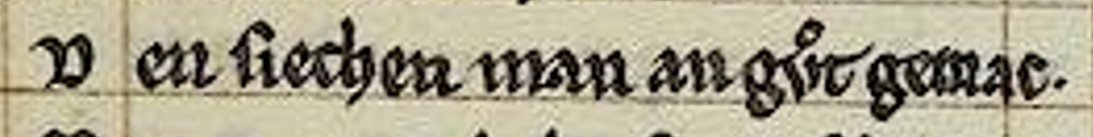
Den ſiechen man an gv°ot gemac.
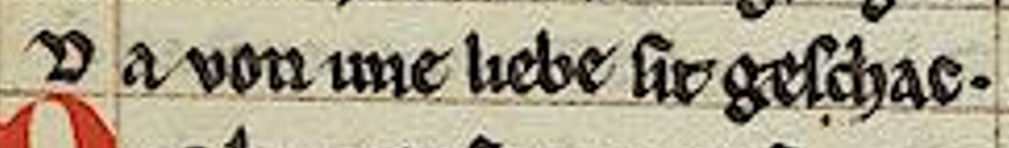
Da von ime liebe ſit geſchac.
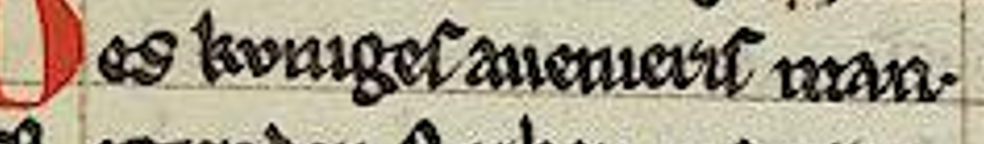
*Des kvnigeſ auenieriſ man.
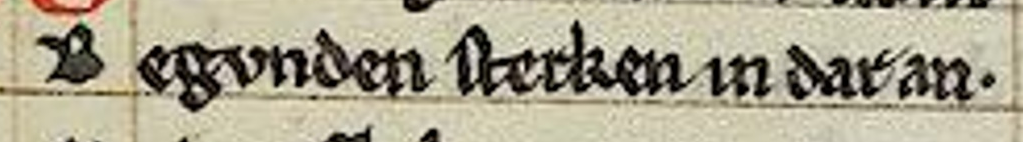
Begvnden ſterken in dar an.
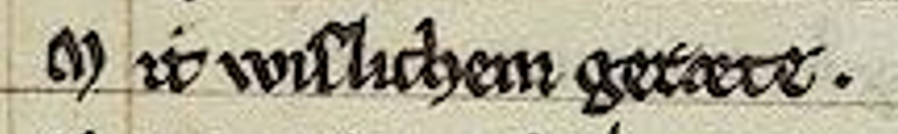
Mit wiſlichem ger[ae]te.
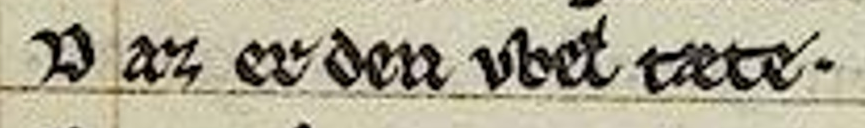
Daz er den vbel t[ae]te.
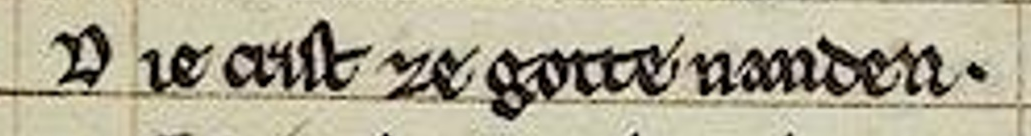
Die criſt ze gotte nanden.
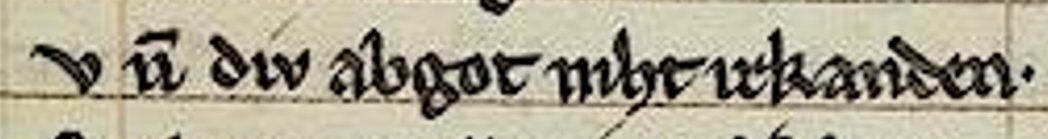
Vn(d) div abgot niht irkanden.
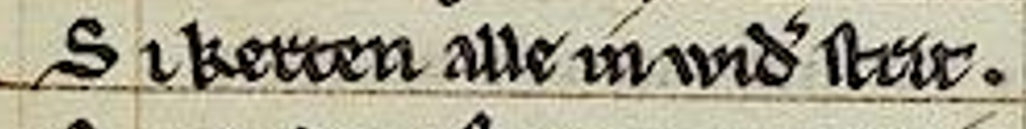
Si kerten alle in wid(er) ſtrit.
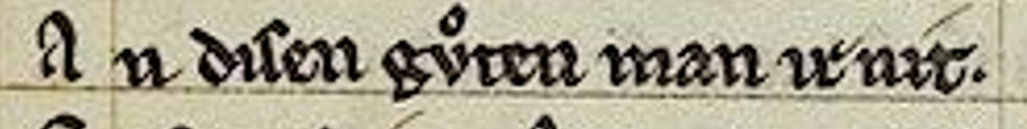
An diſen gv°oten man ir nit.
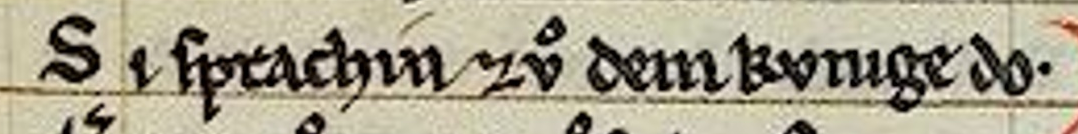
Si ſprachin zv°o dem kvnige do.
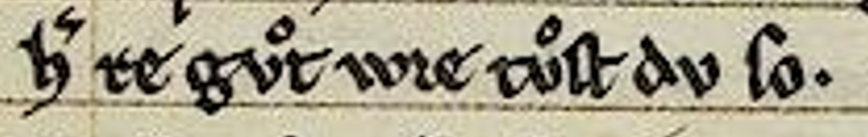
H(er)re gv°ot wie tv°oſt dv ſo.
